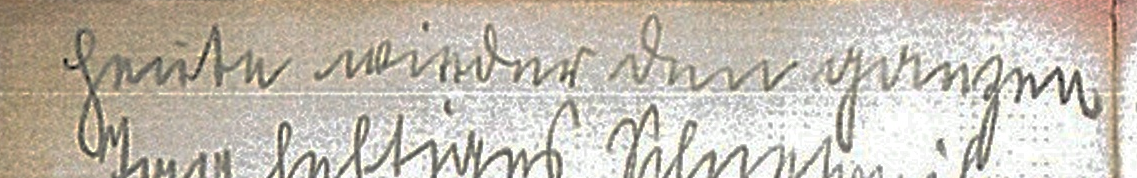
heute wieder den ganzen
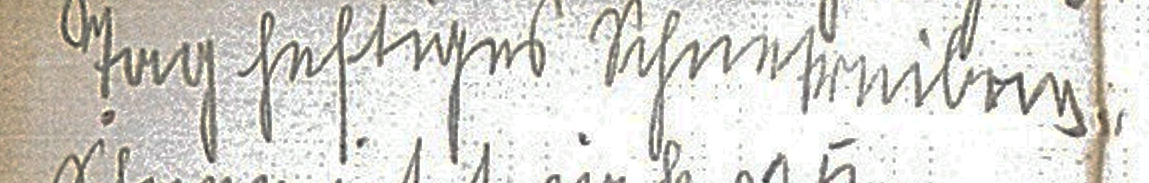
Tag hefstiges Schneetreiben
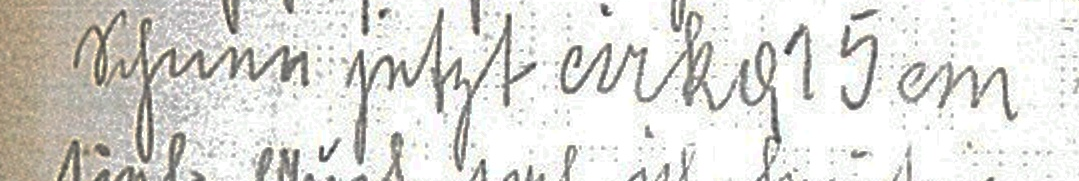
Schnee jetzt cirka 15 cm
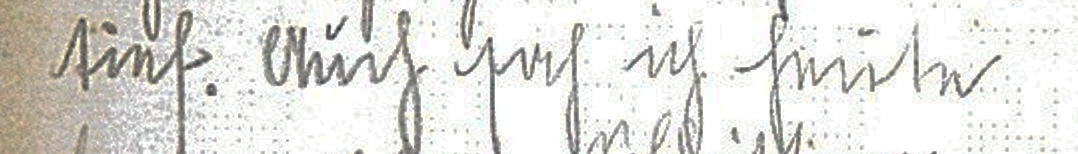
tief. Auch sah ich heute
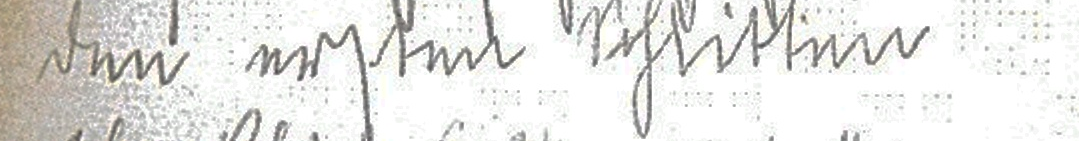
den ersten Schlitten
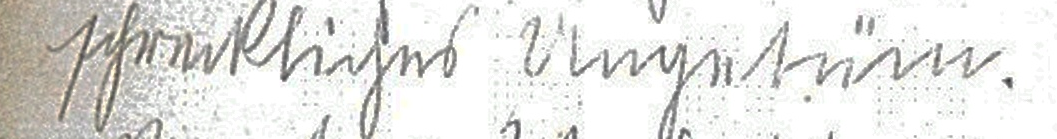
schreckliches Ungetüm.
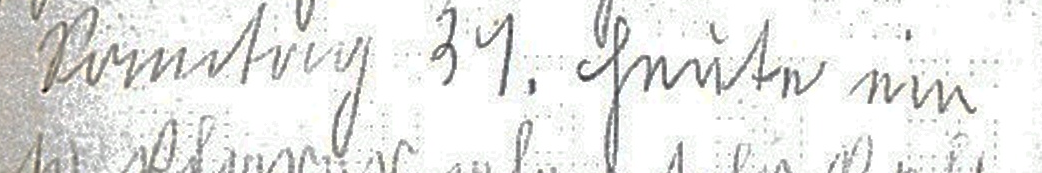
Sonntag 31. Heute ein
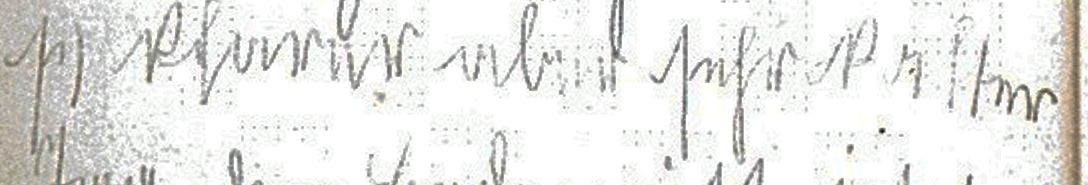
sehr klarer aber sehr kalter
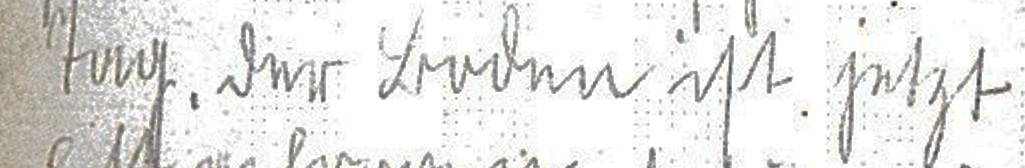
Tag. Der Boden ist jetzt
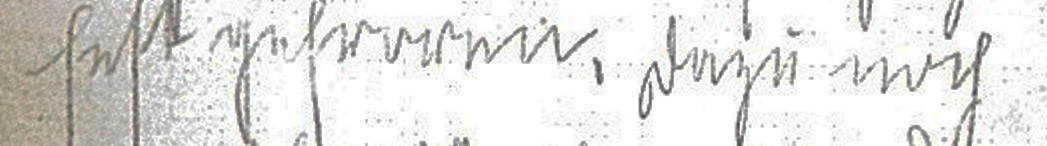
fest gefroren, dazu noch
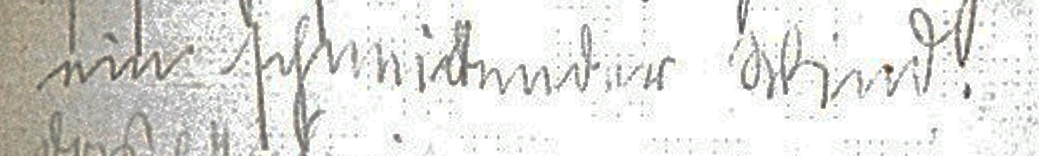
ein schneidender Wind.
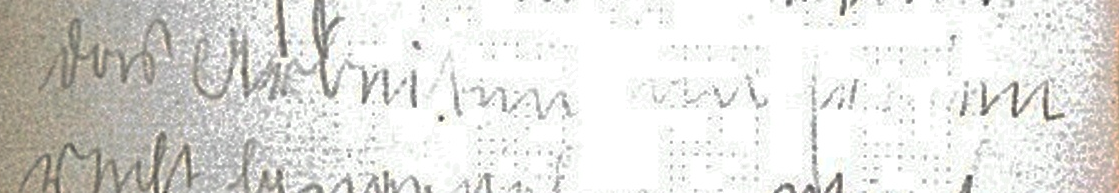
Das Arbeiten im freien
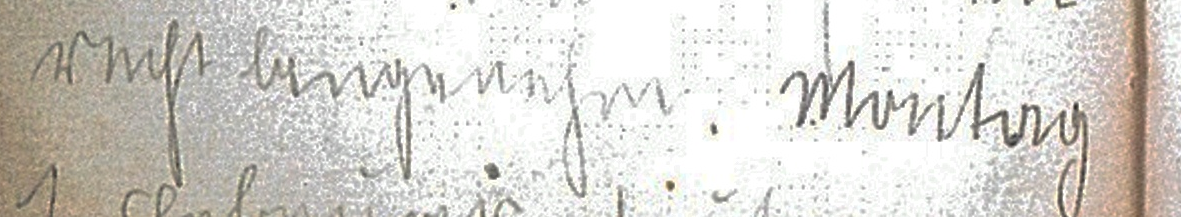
recht langsam. Montag
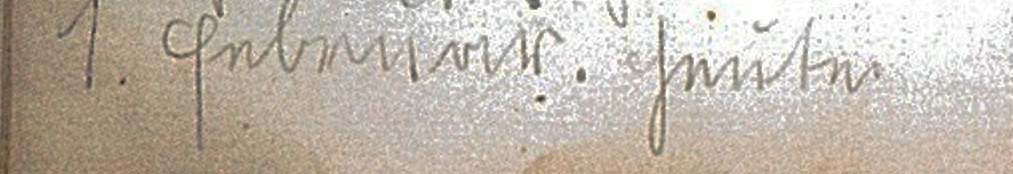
1. Februar heute
